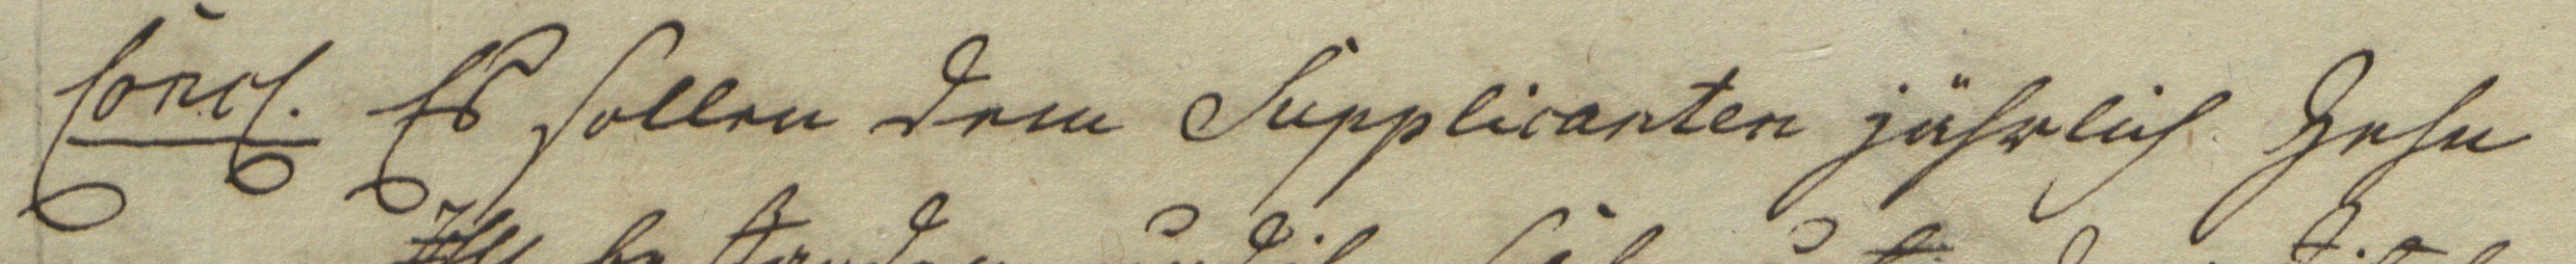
Concl. Es sollen dem Supplicanten jährlich Zehn
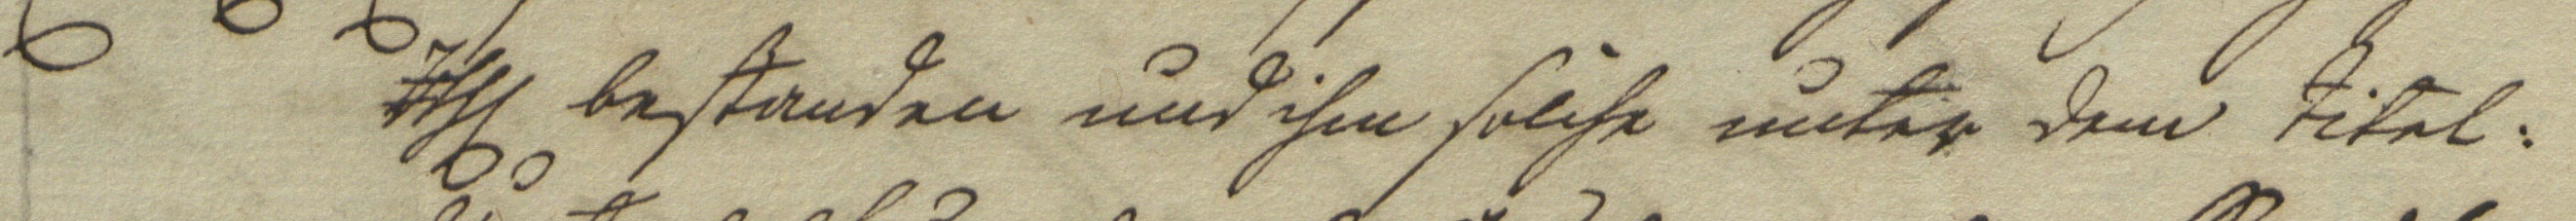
Rthl. bestanden und ihm solche unter dem Titel:
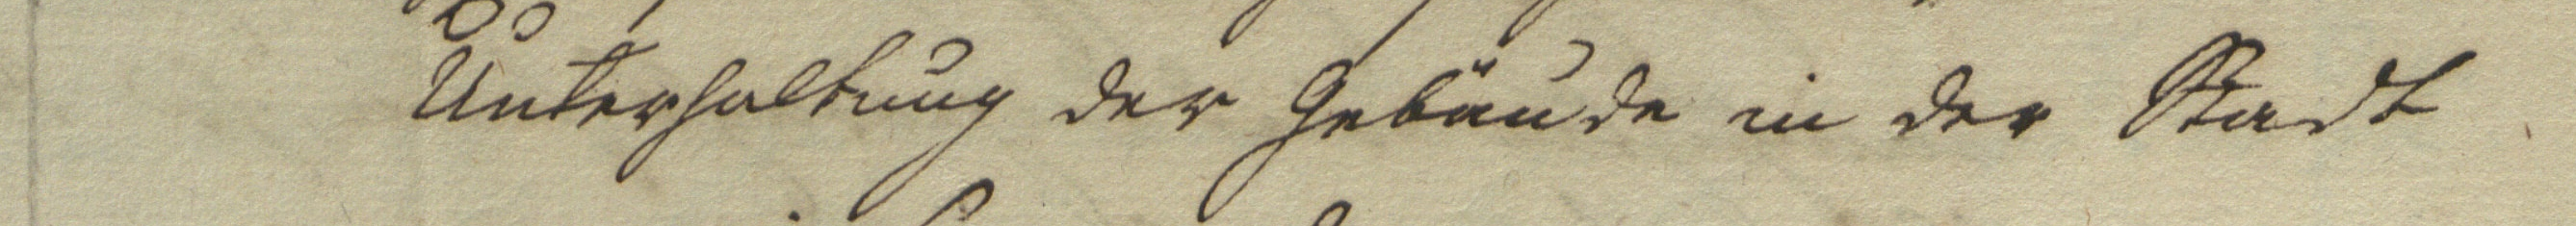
Unterhaltung der Gebäude in der Stadt
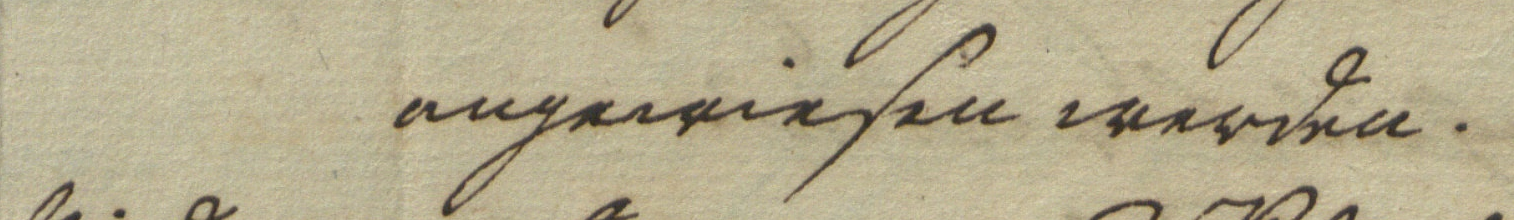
angewiesen werden.
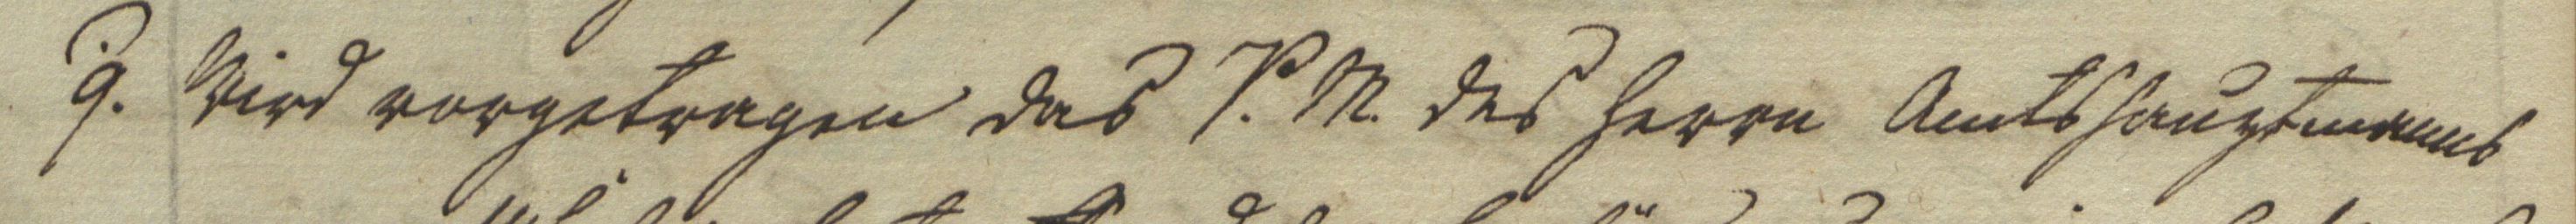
9. Wird vorgetragen, das P. M. des Herrn Amtshauptmanns
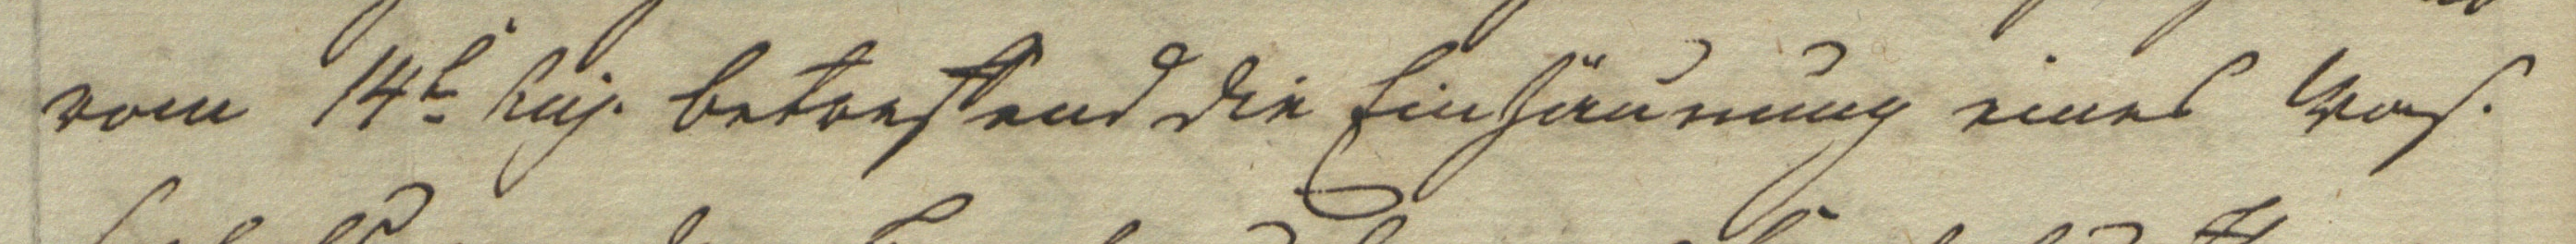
vom 14ten huj. betreffend die Enzäunung eines Was¬
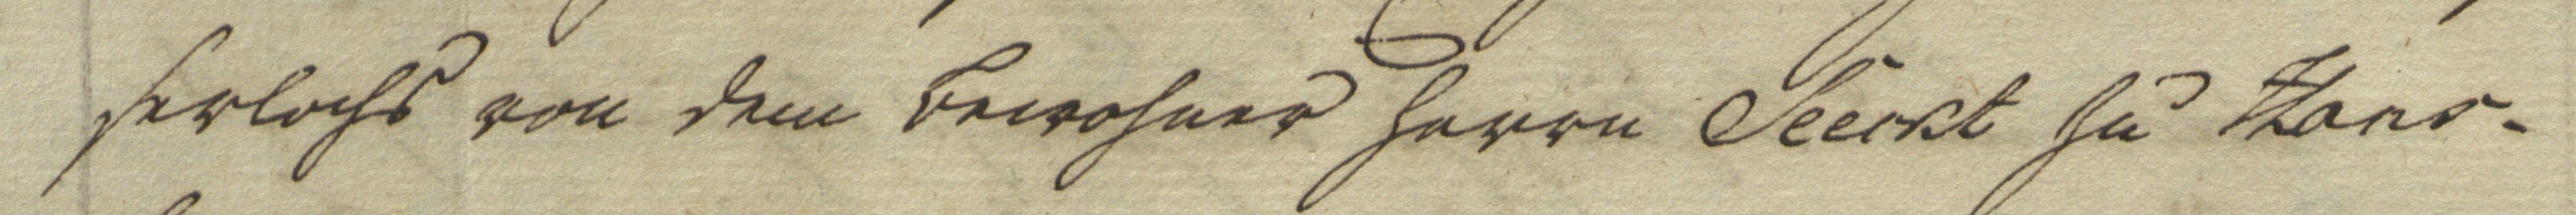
serlochs von dem Bewohner Herrn Seeckt zu Hans¬
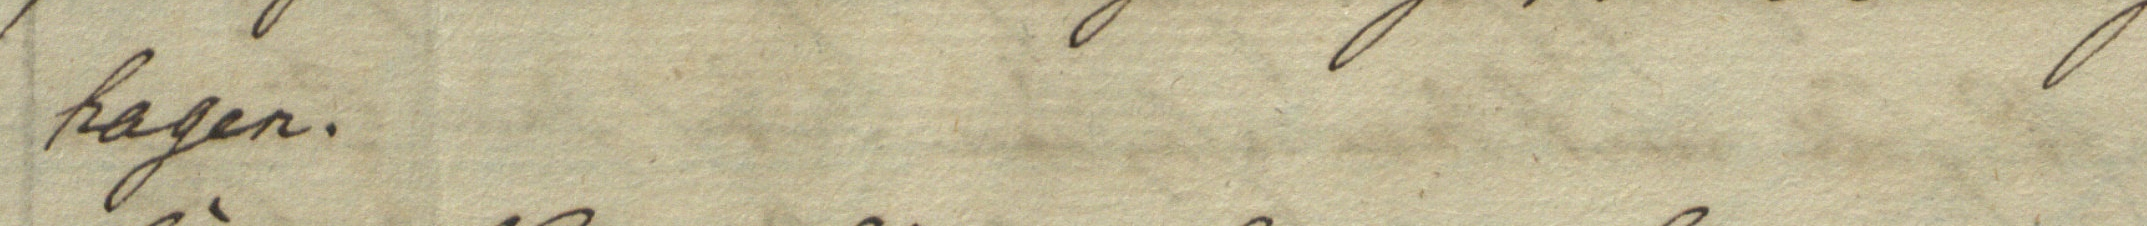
hagen.
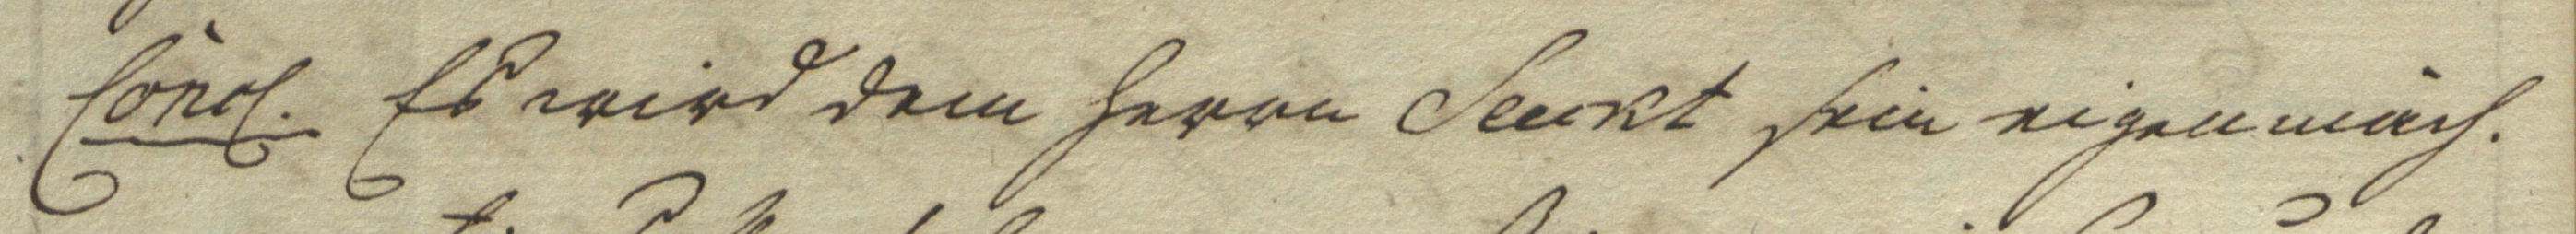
Concl. Es wird dem Herrn Seeckt sein eigenmäch¬
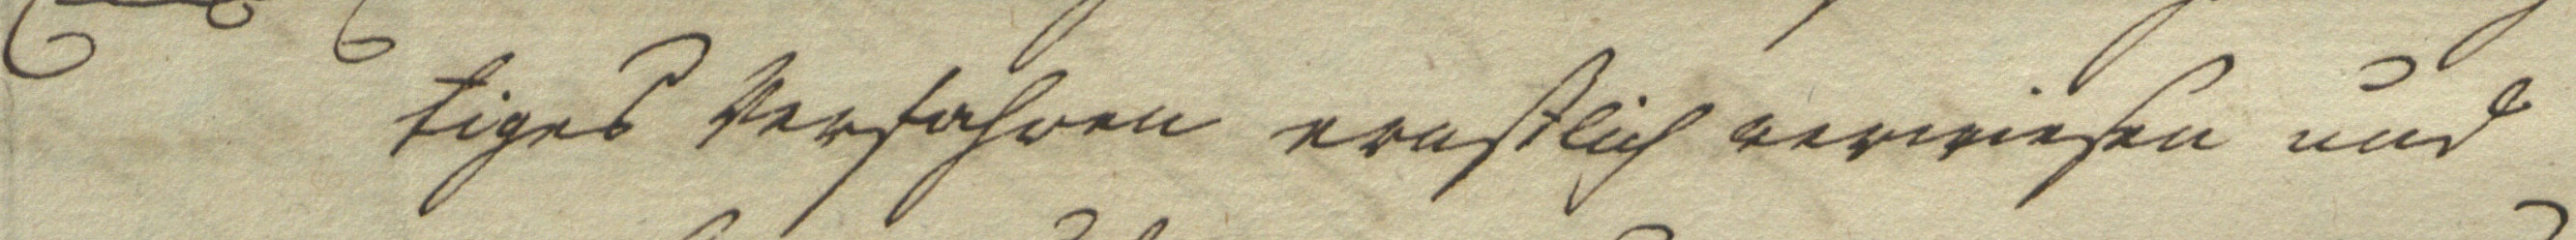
tiges Verfahren ernstlich verwiesen und
